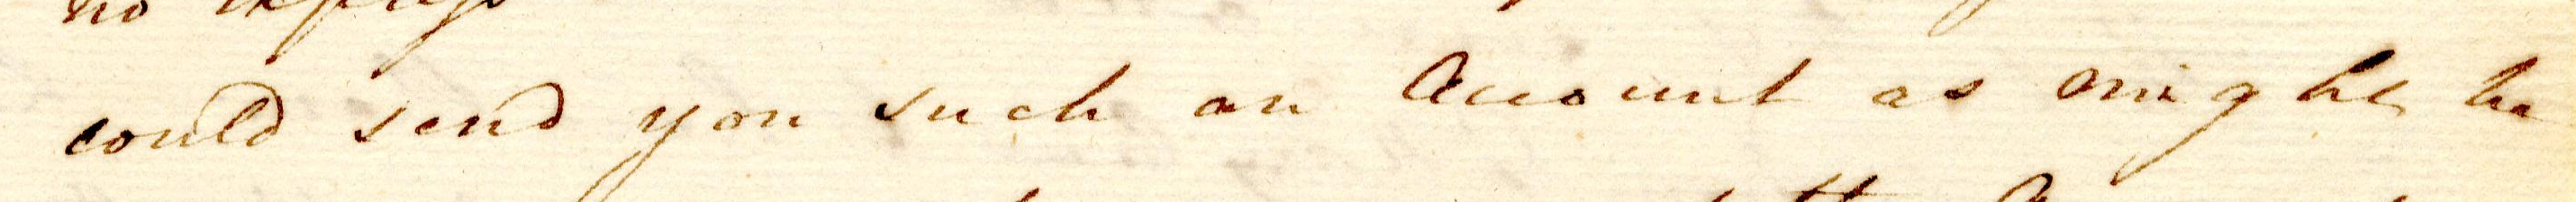could send you such an Account as might be
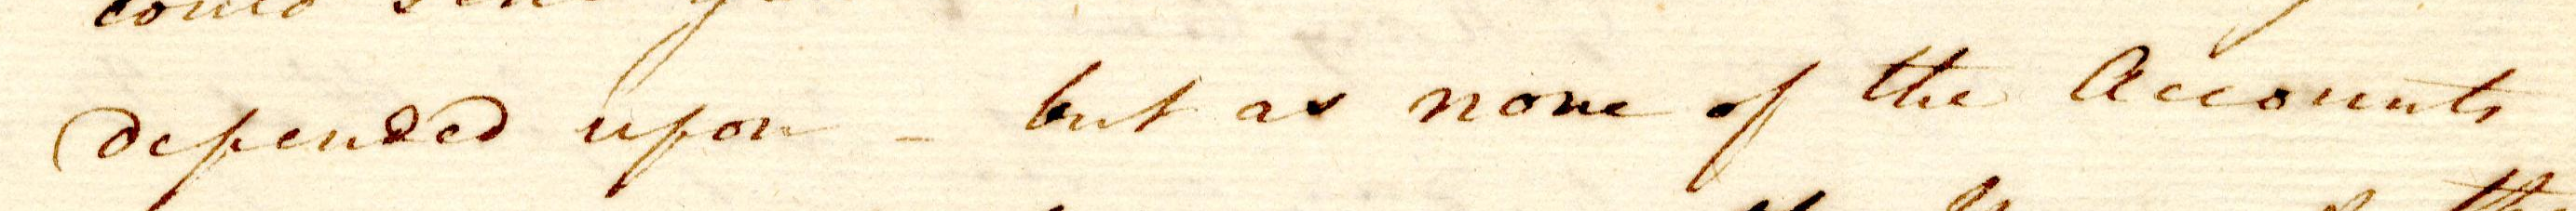depended upon, but as none of the Accounts
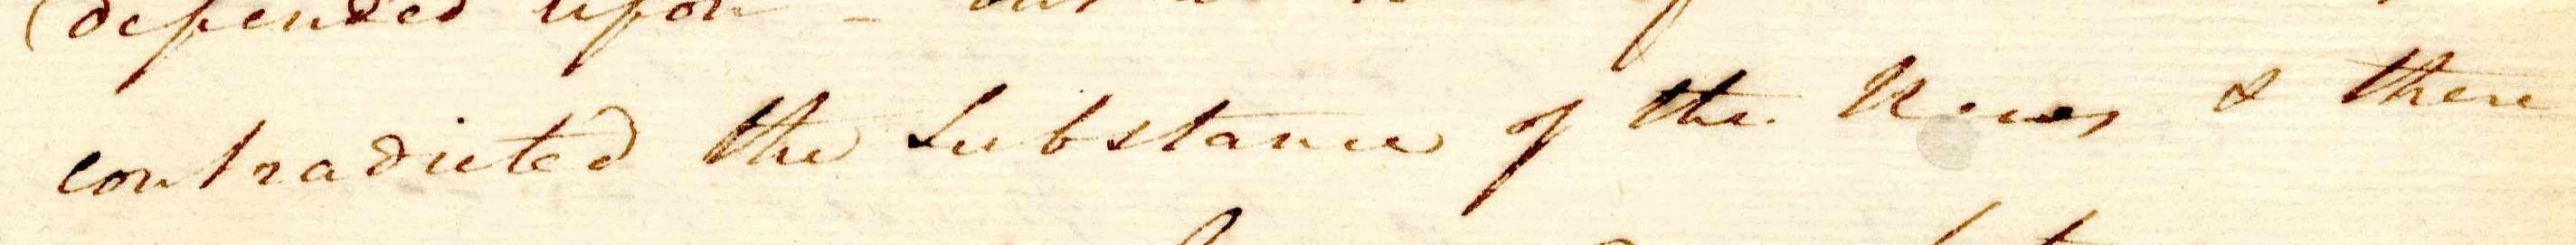contradicted the Substance of the News & there
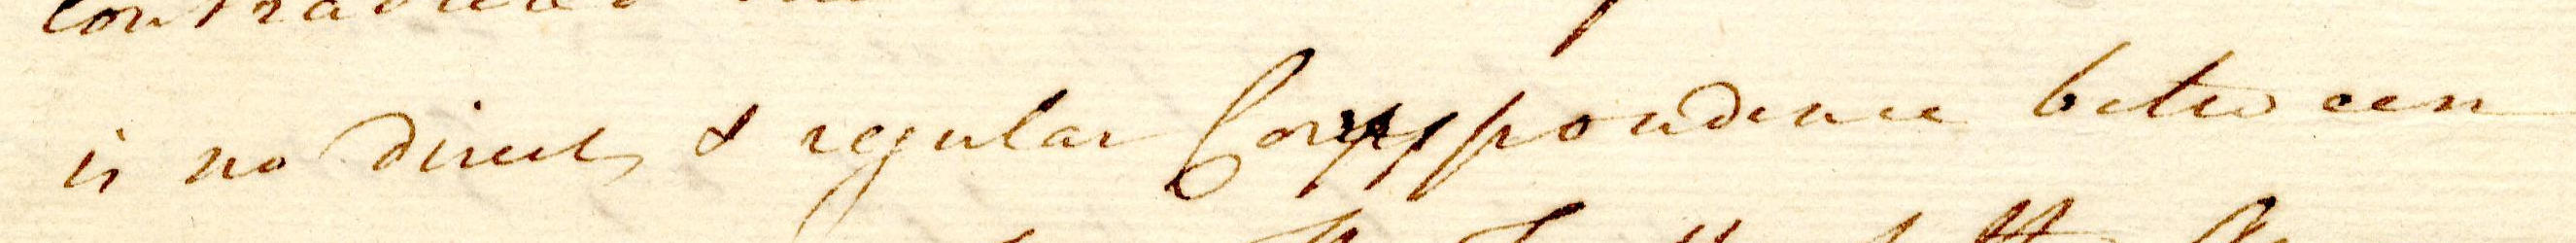is no direct, & regular Correspondence between
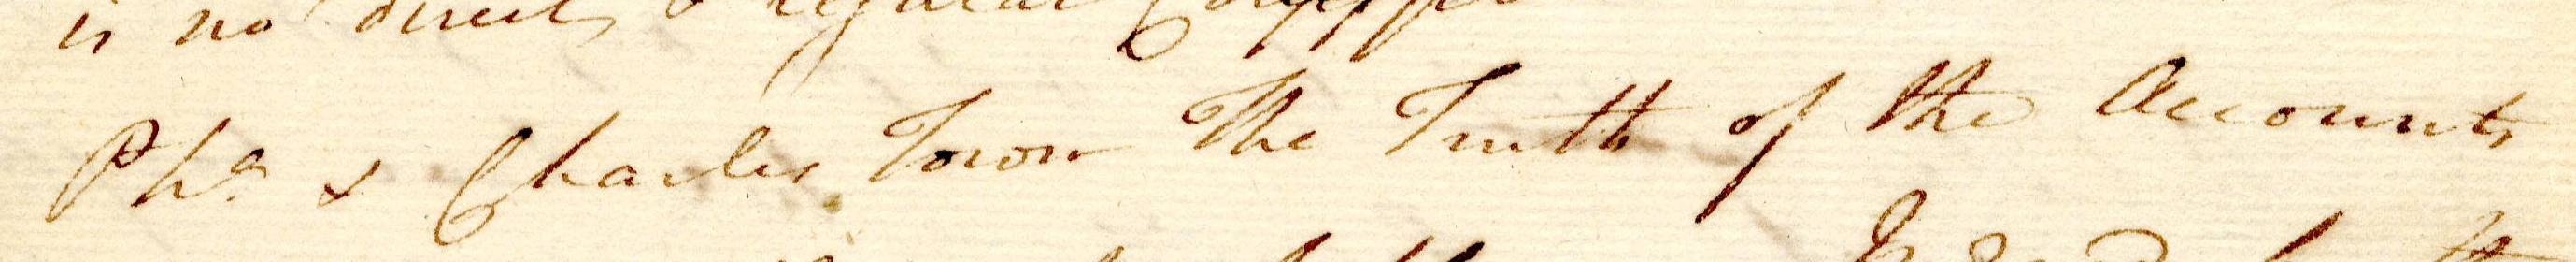Ph^a. & Charles Town The Truth of the Accounts
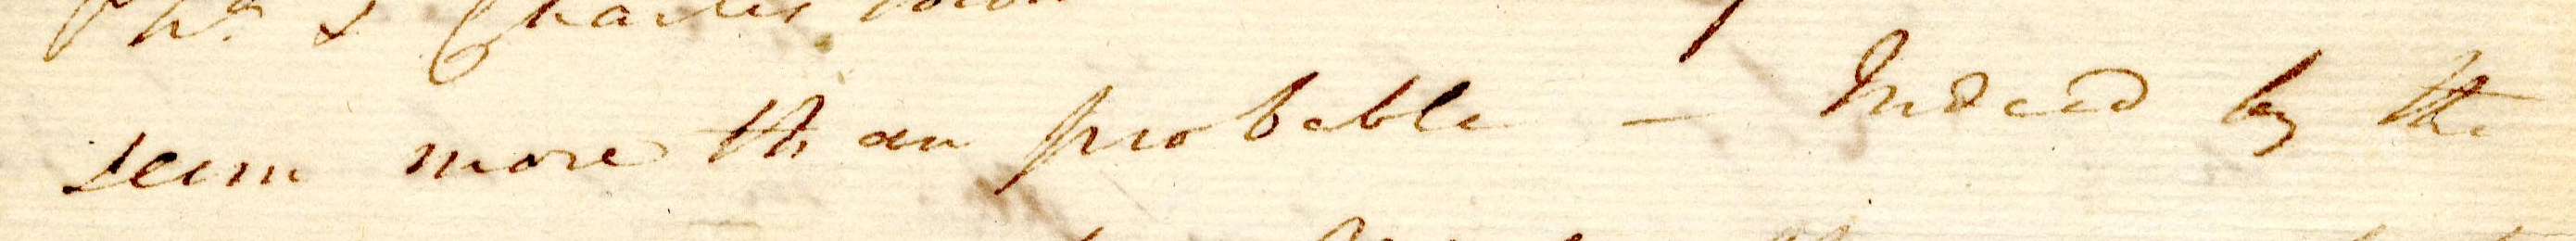seem more than probable. Indeed by the
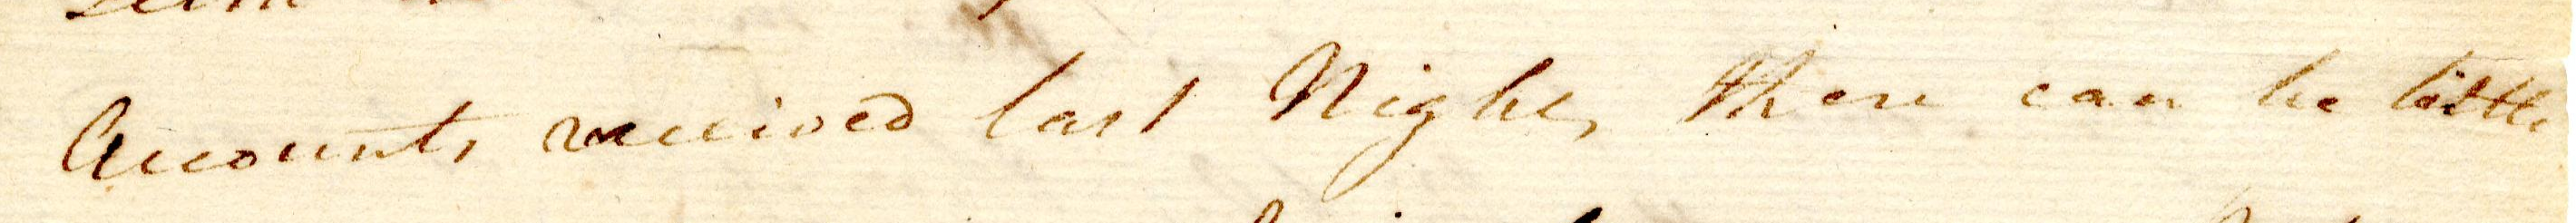Account received last Night, there can be little
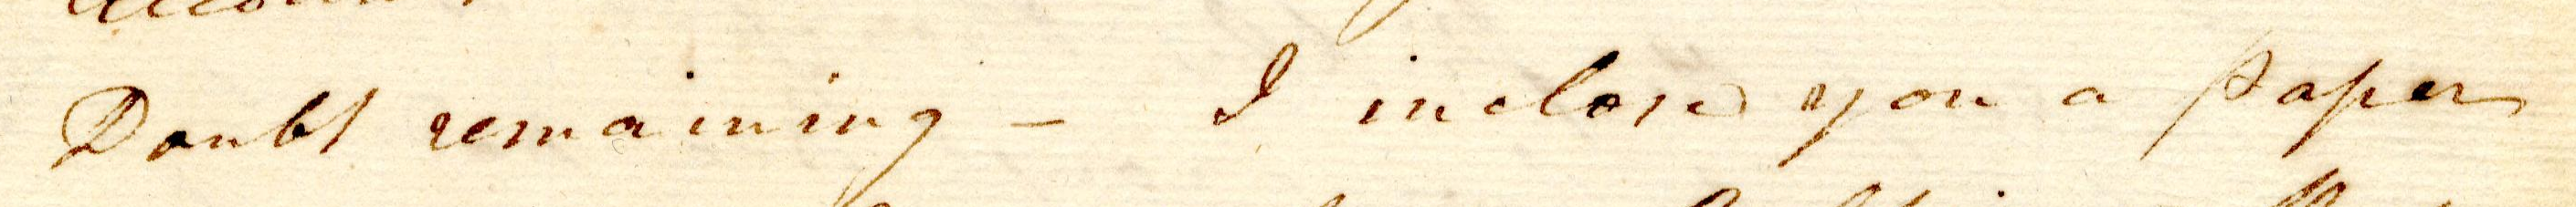Doubt remaining. I inclose you a paper
